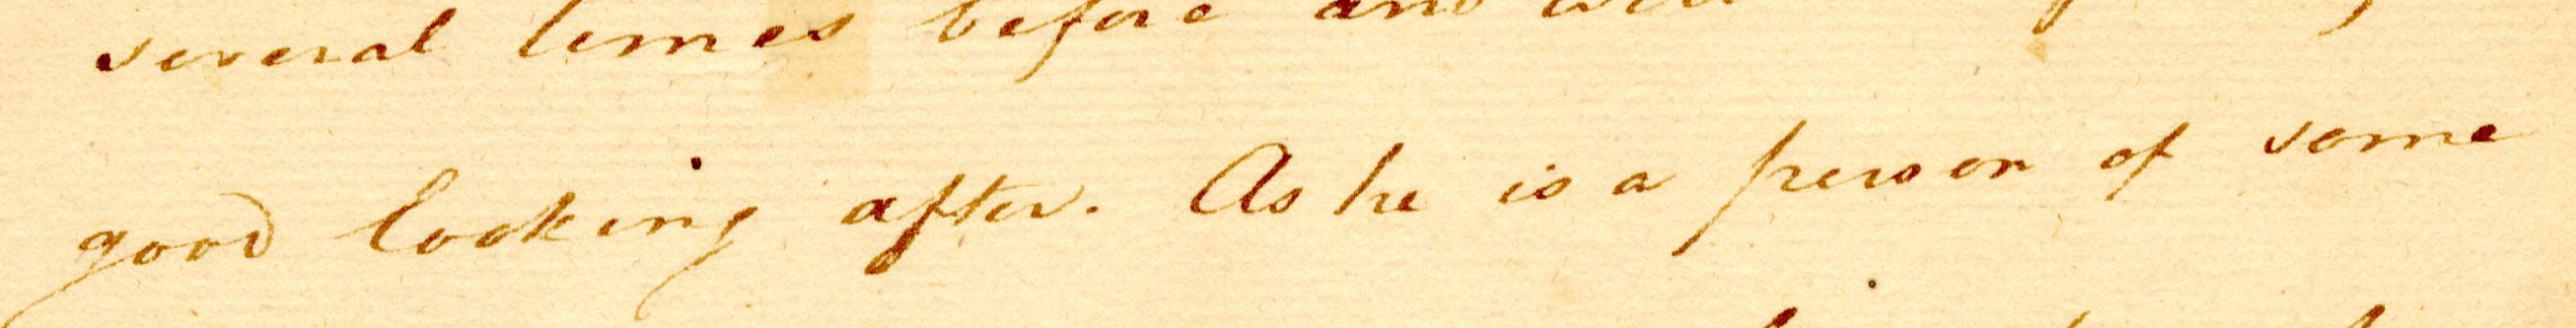good looking after. As he is a person of some
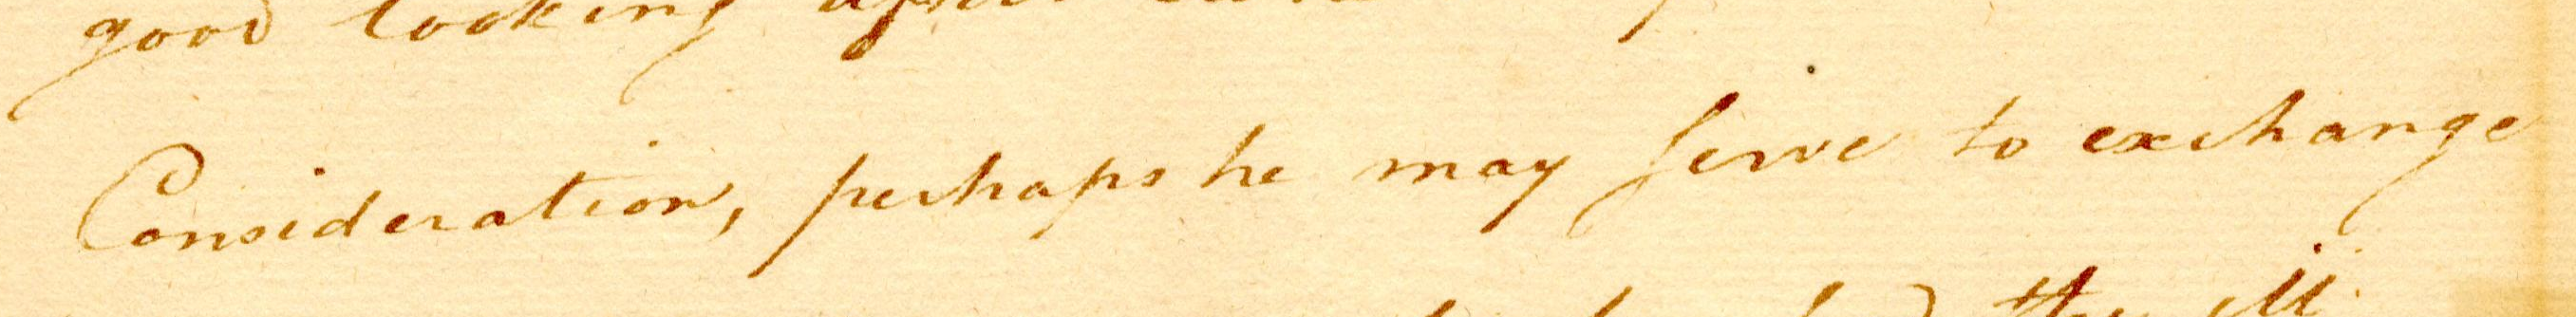Consideration, perhaps he may serve to exchange
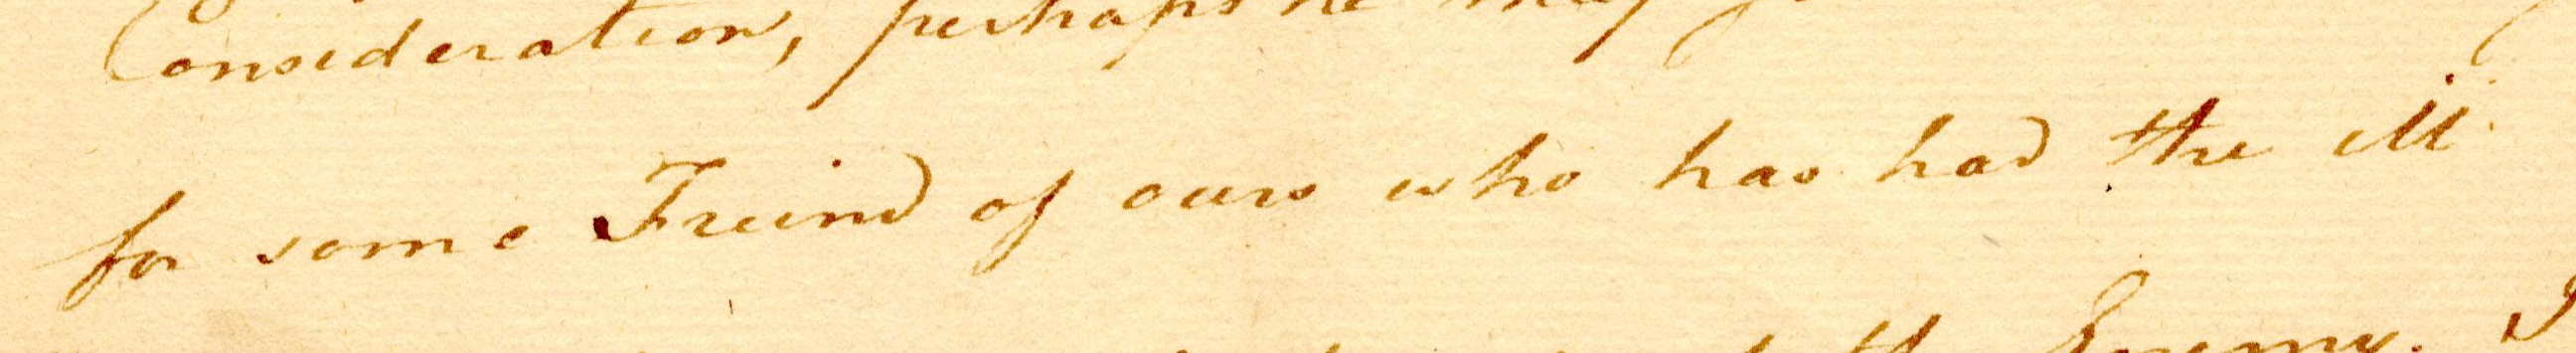for some Friend of ours who has had the ill
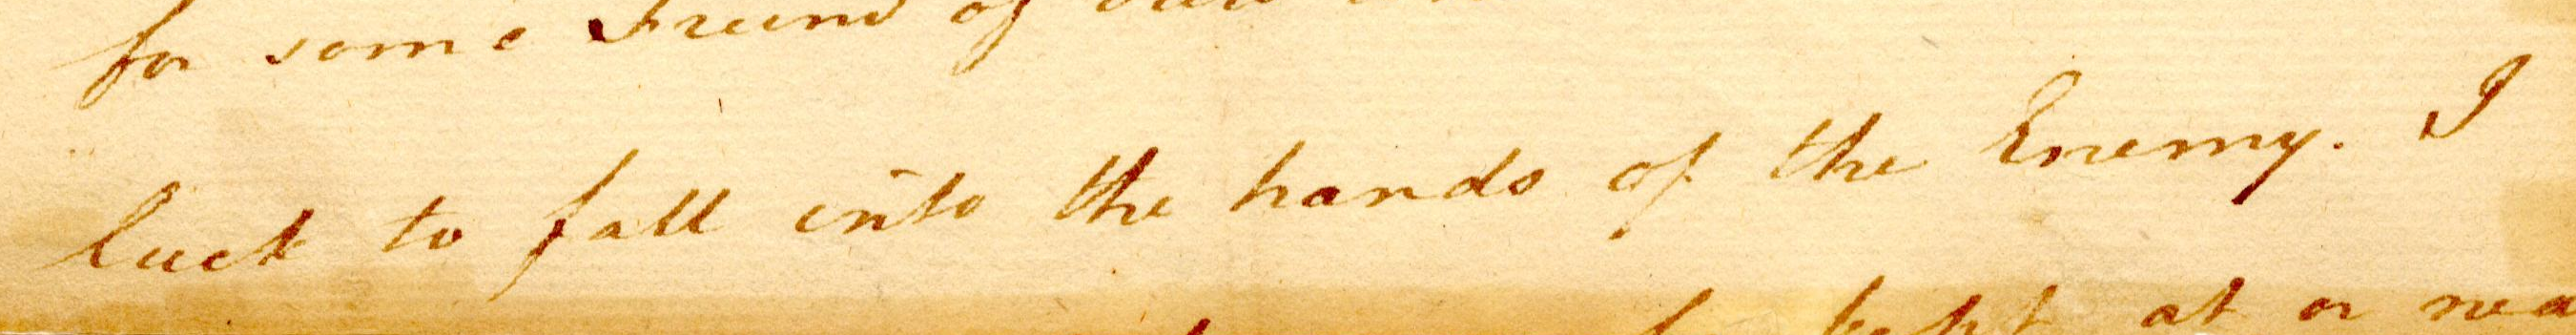luck to fall into the hands of the Enemy. I
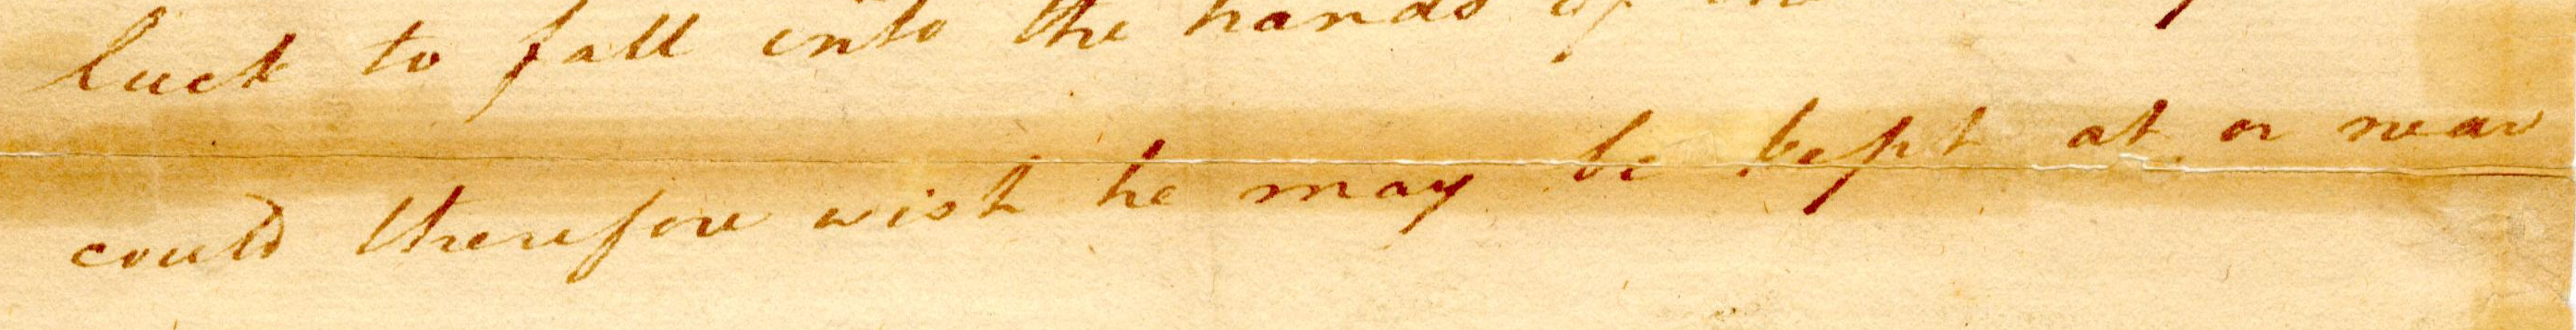could therefore wish he may be kept at or near
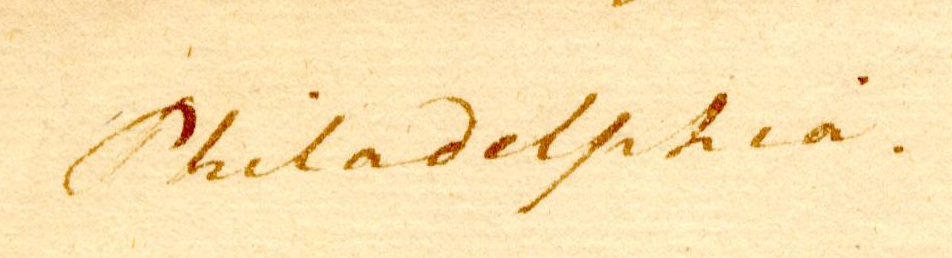Philadelphia.
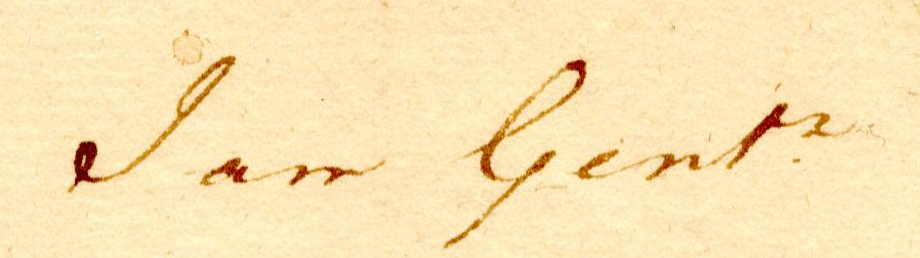I am Gent^n.
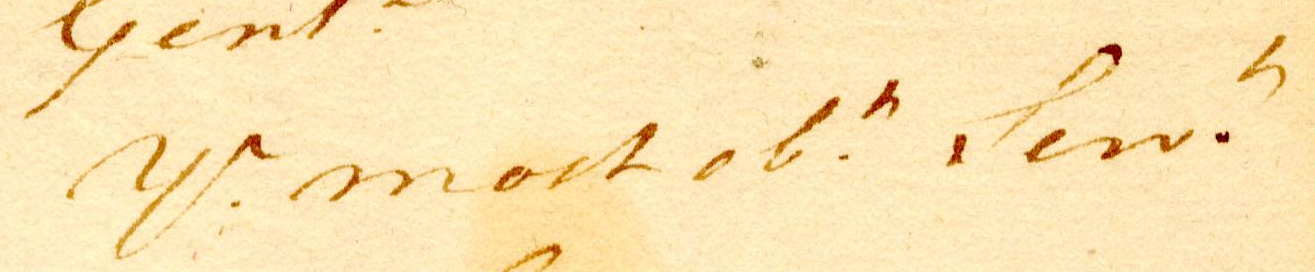y^r. most ob^t. Ser^.
